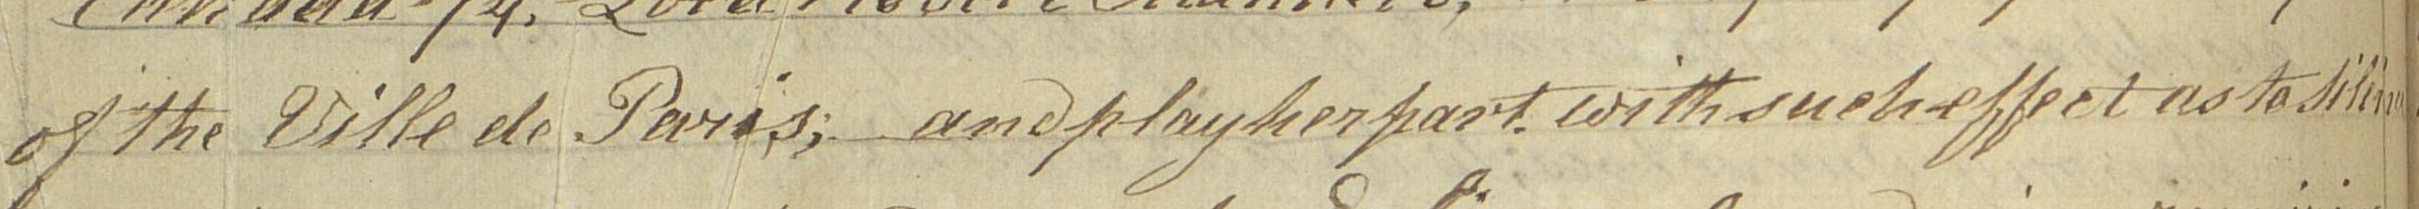of the Ville de Paris; and play her part with such effect us to sile-
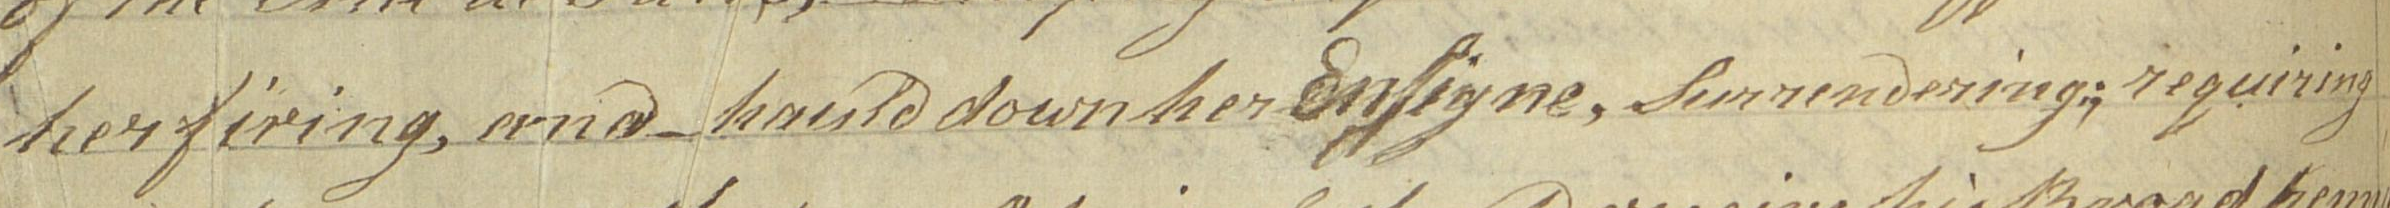her firing, and hauld down her Engine, surrendering; reguring
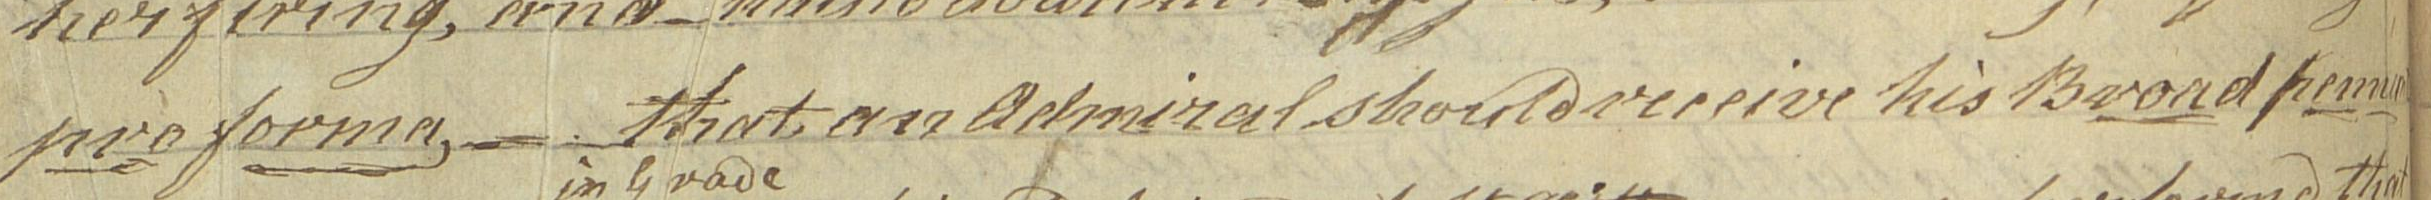pro forma, that an Admiral should receive his Brond pem-
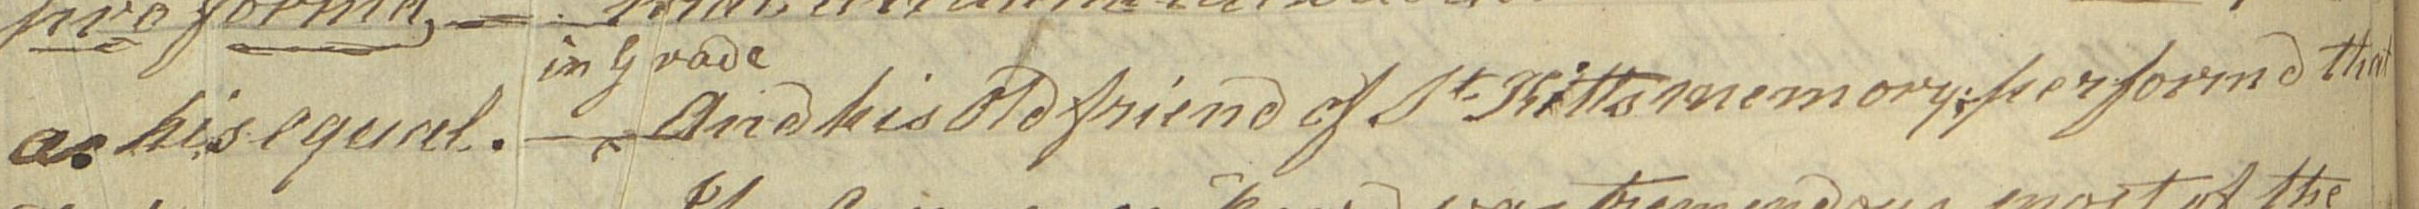as his equal. ^ And his Old friend of S^t Kitts memory; performd that
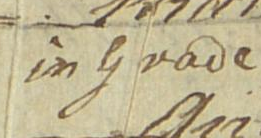in Grade
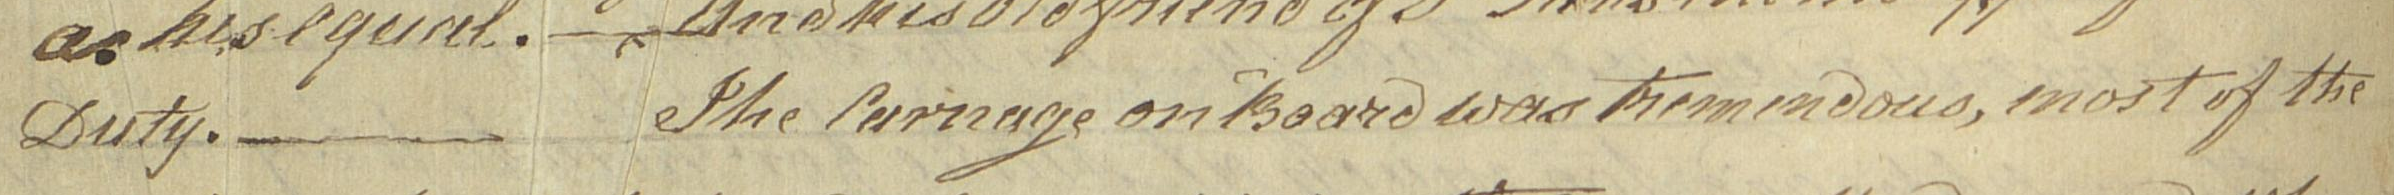Duty. The Carnage on Board was tremendous, most of the
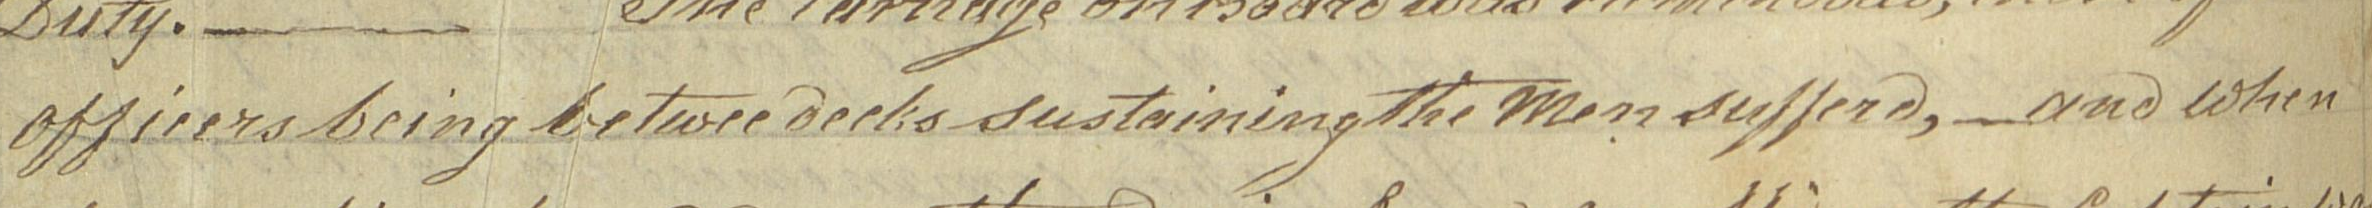Officers being betwee decks sustaining the Men sufferd, and when
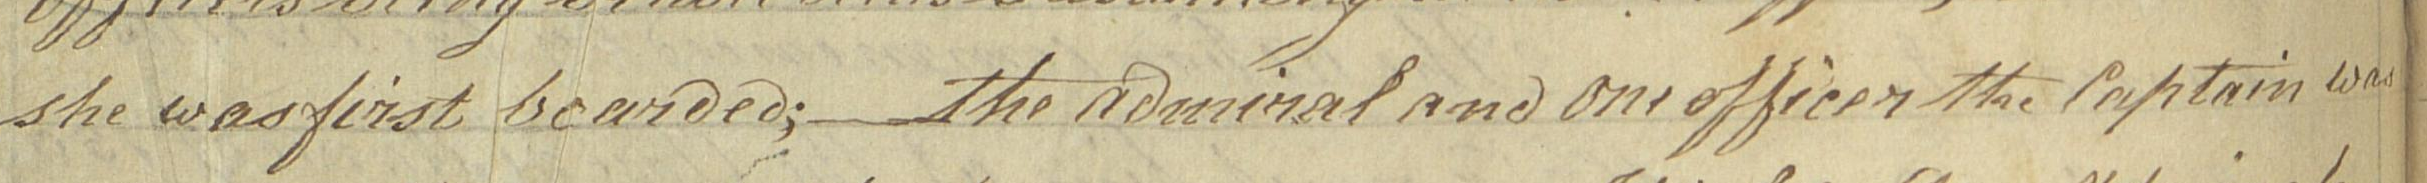she was first bearded; The admiral and one officer the Captain was
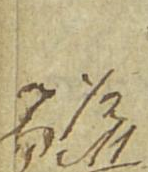7 1/2
